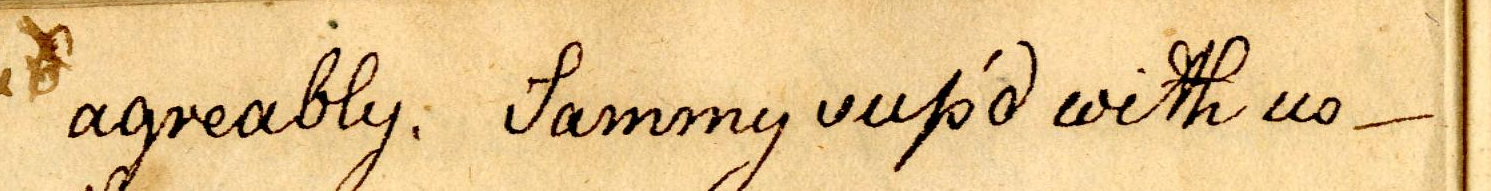agreably. Sammy sup'd with us -
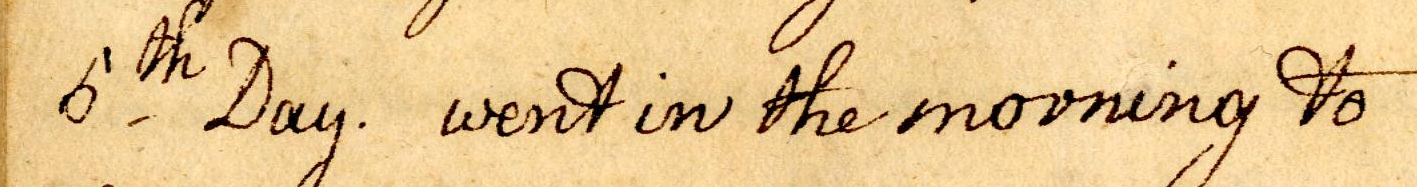5^th Day. went in the morning to
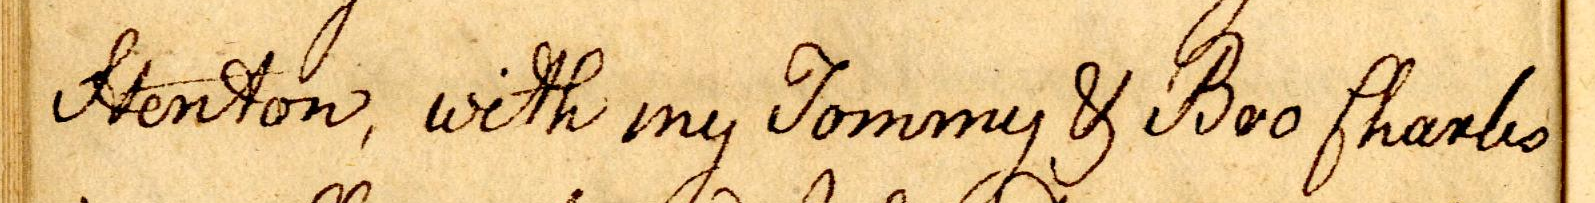Stenton, with my Tommy & Bro Charles
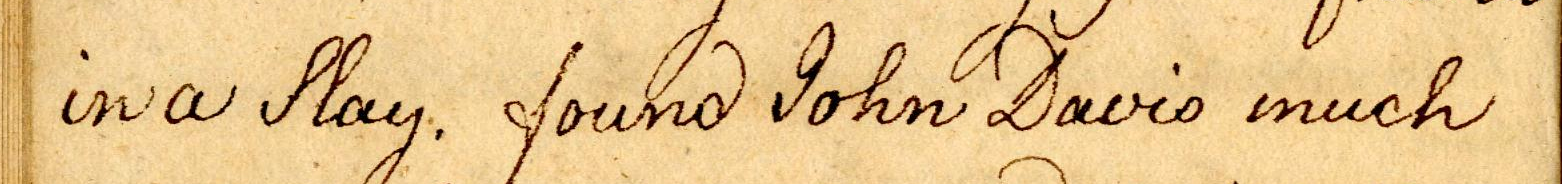in a Slay. found John Davis much
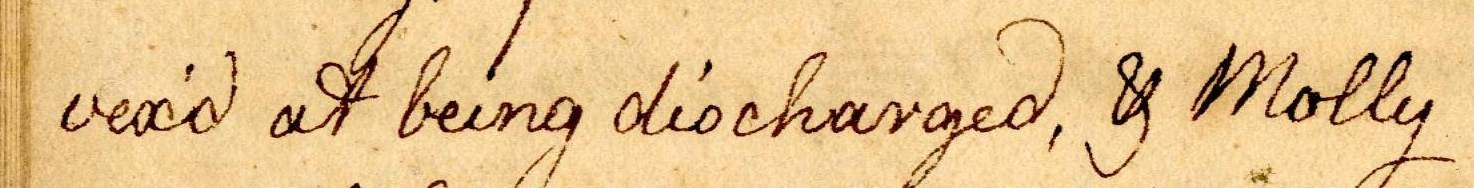vex'd at being discharged, & Molly
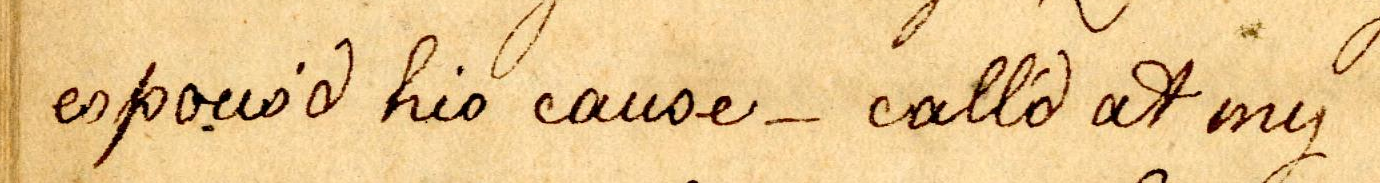espous'd his cause- call'd at my
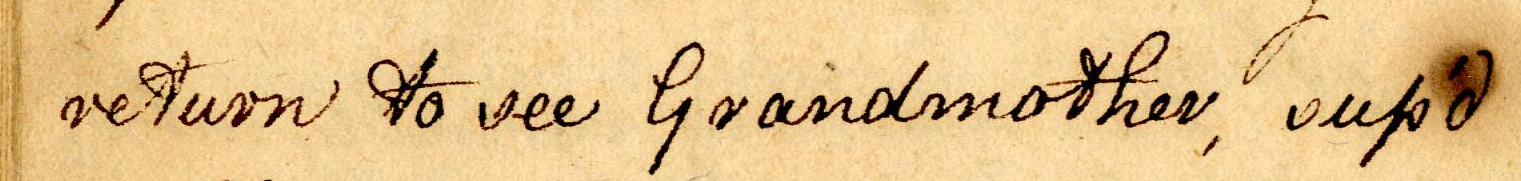return to see Grandmother, sup'd
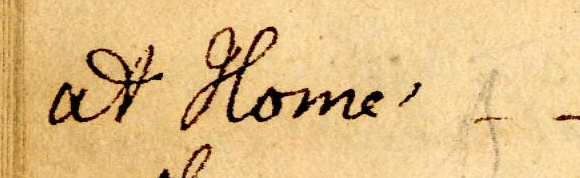at Home -
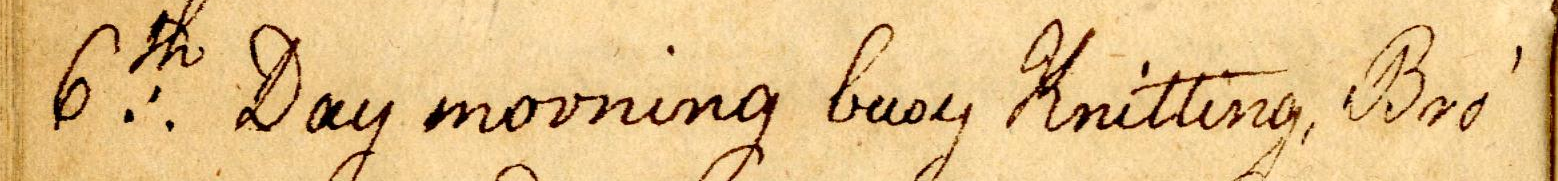6^th Day morning busy Knitting, Bro'
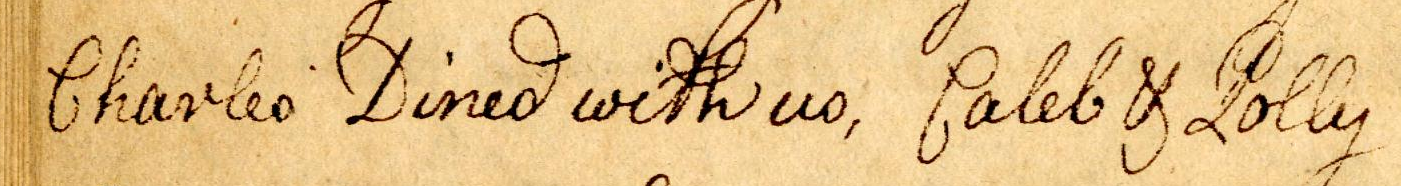Charles Dined with us, Caleb & Polly
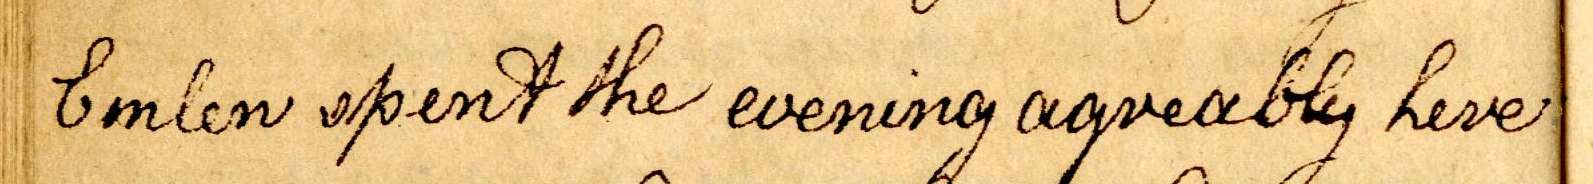Emlen spent the evening agreably here
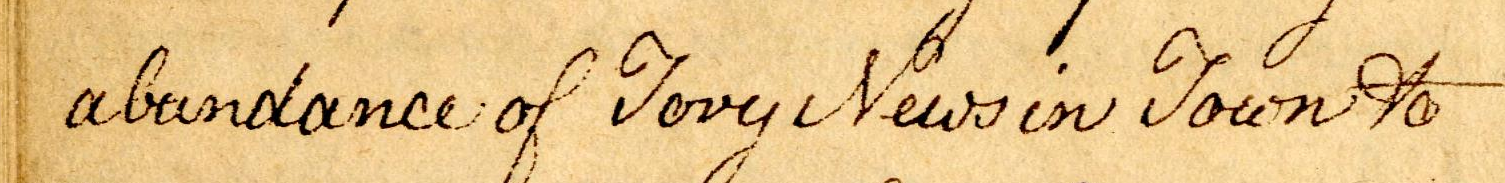abundance of Tory News in Town to
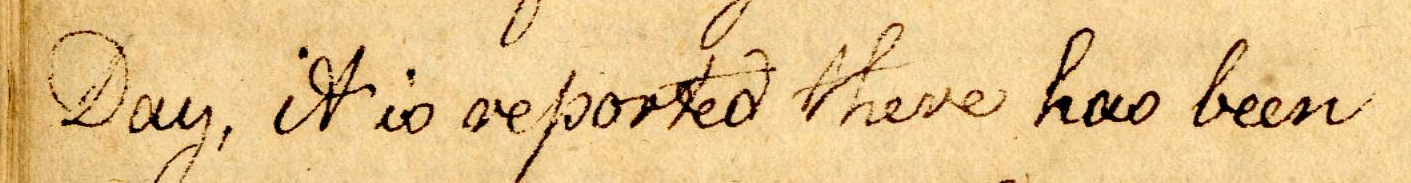Day, it is reported there has been
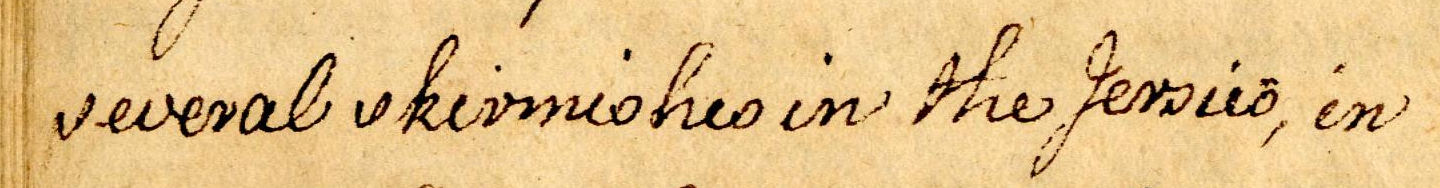several skirmishes in the Jersies, in
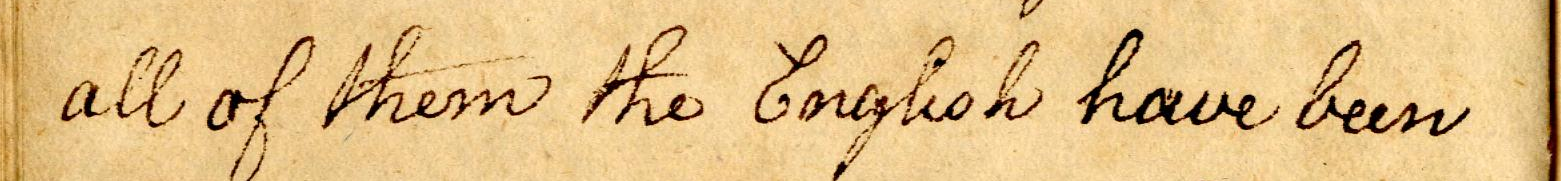all of them the English have been
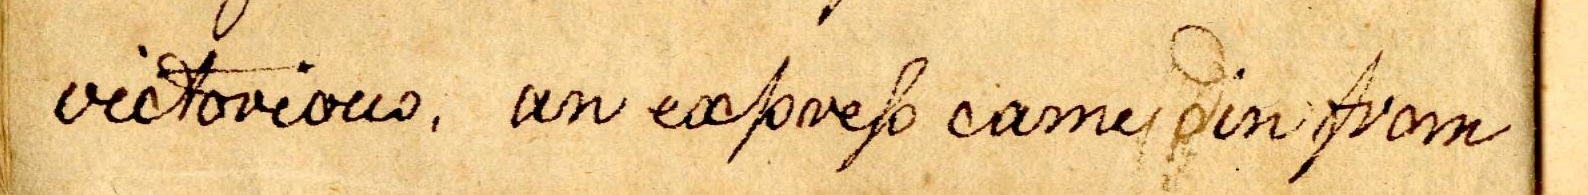victorious, an express came din from
